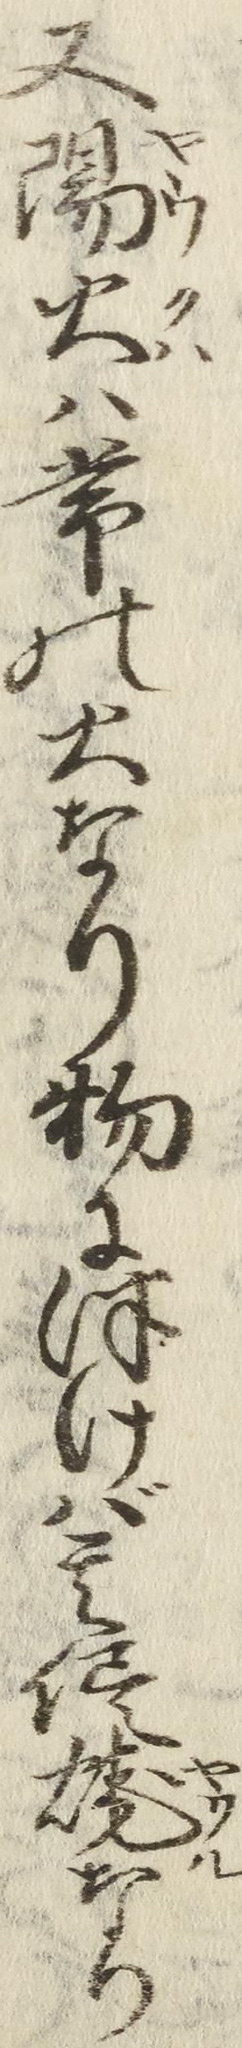又陽火は常の火なり物につけば其侭焼なり
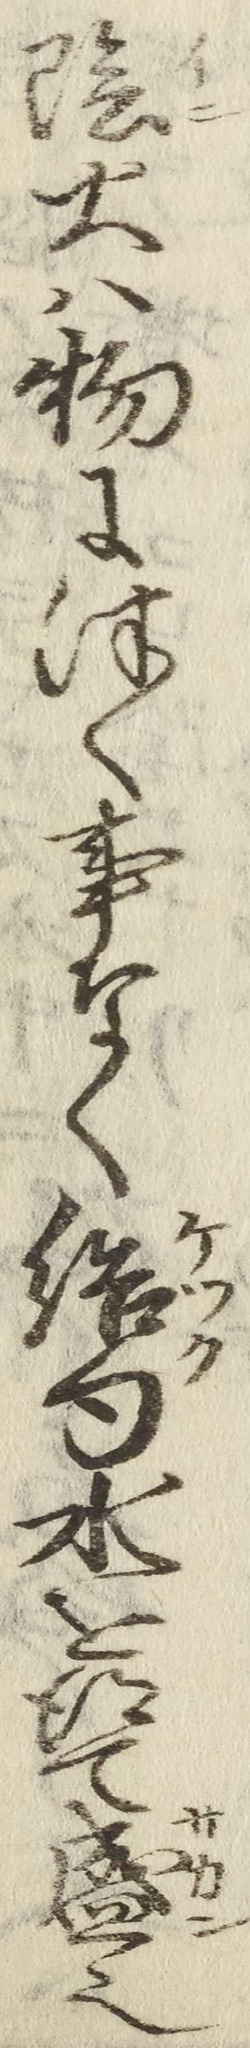陰火は物につく事なく結句水を得て盛也

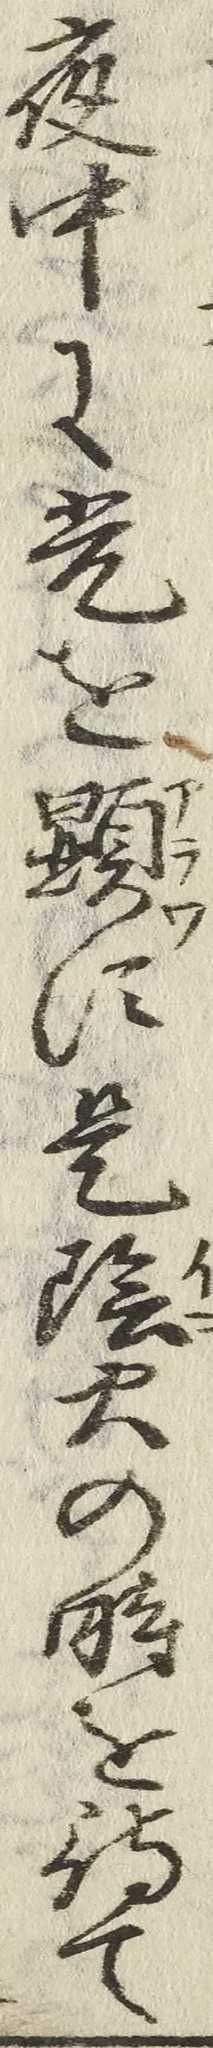夜中に光を顕す是陰火の時を得て
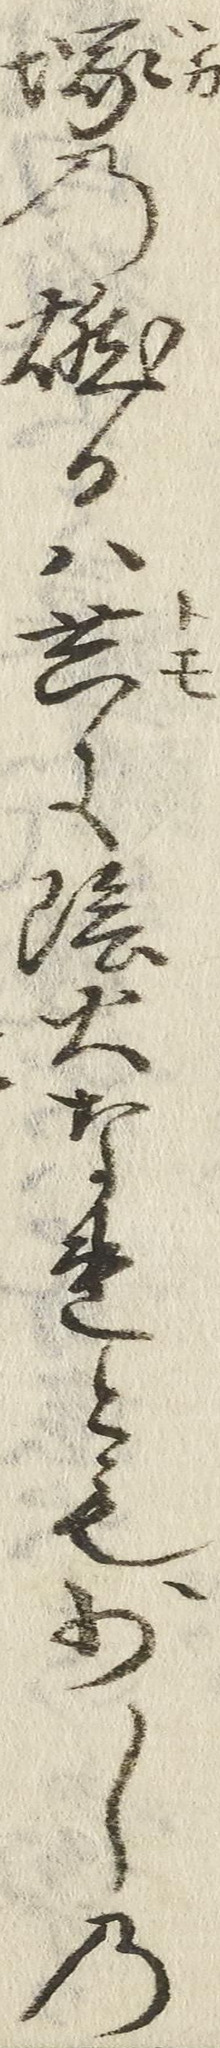塚の燃るは共に陰火なれとも少しの
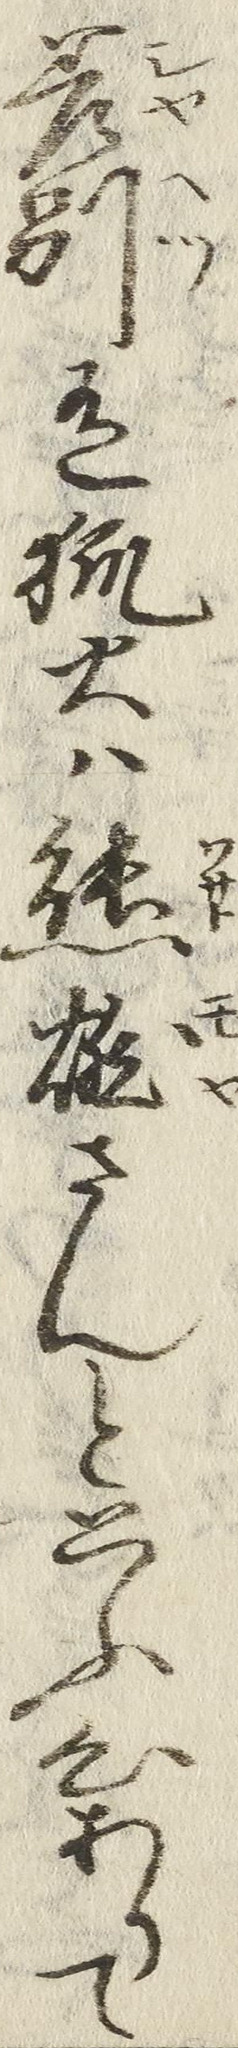差別有狐火は態燃さんと思ふ心ありて
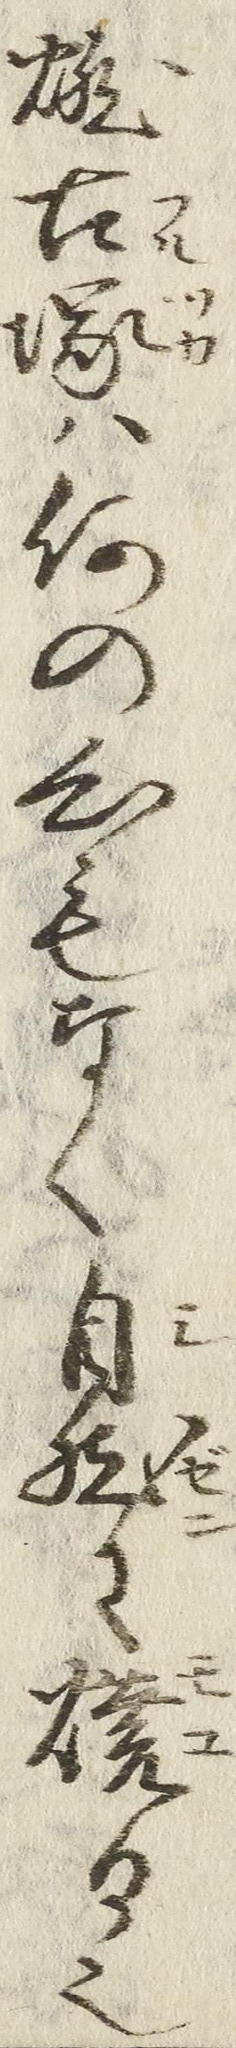燃古塚は何の心もなく自然に焼る也
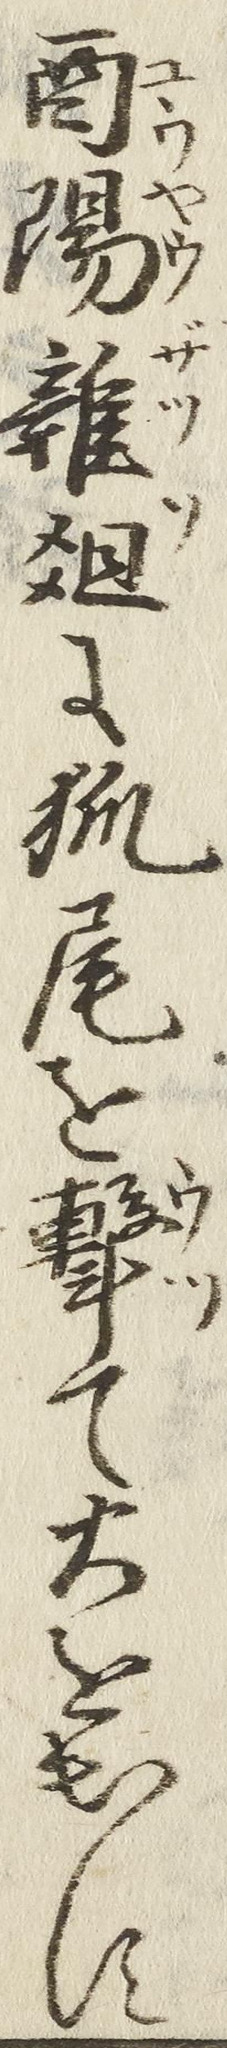酉陽雑爼に狐尾を撃て火を出す
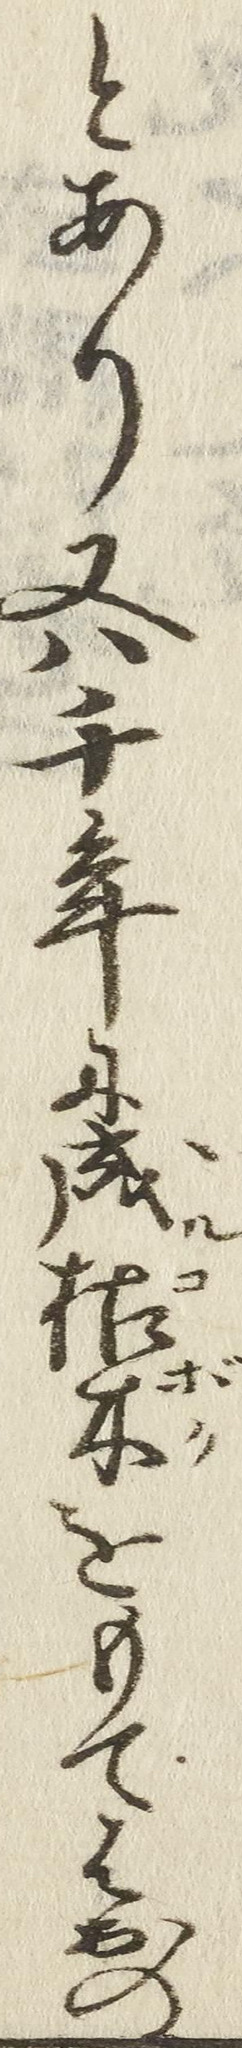とあり又は千年に成ル枯木をもてはおの
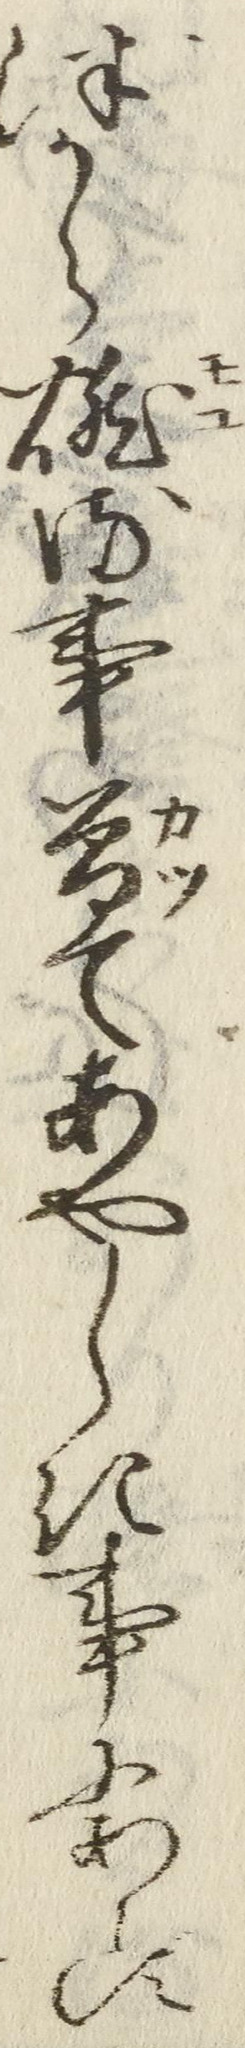つから燃る事曽てあやしき事にあらす
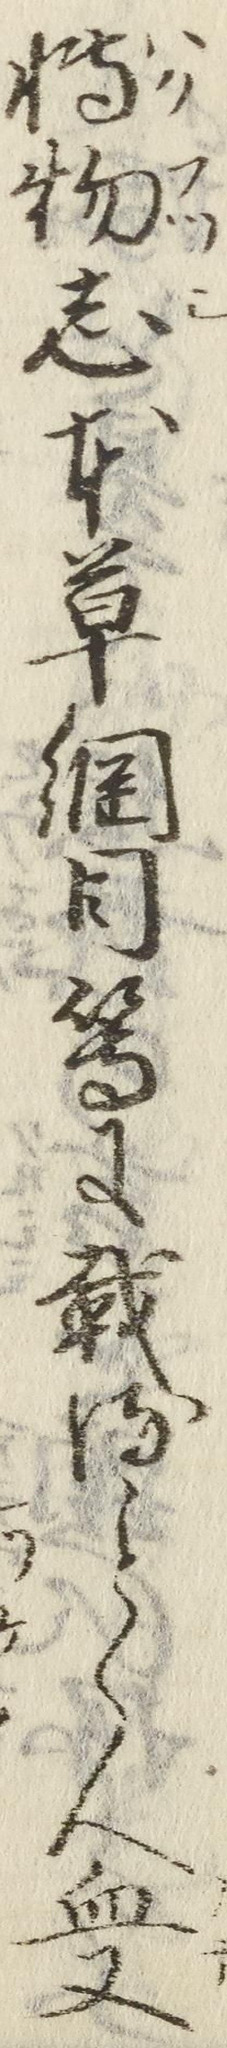博物志本草綱目等に載ることく人ノ血又
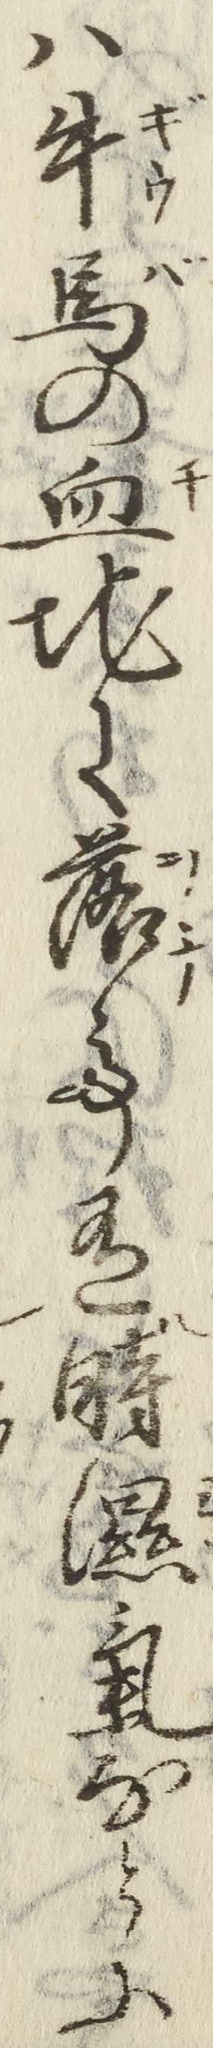は牛馬の血地に落て有ル時湿気なとに
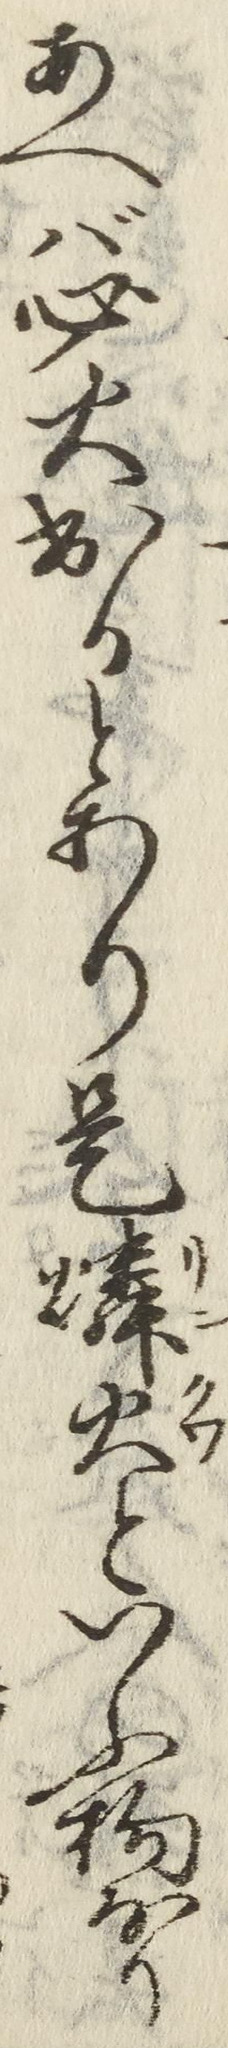あへば必火出るとあり是燐火といふ物なり
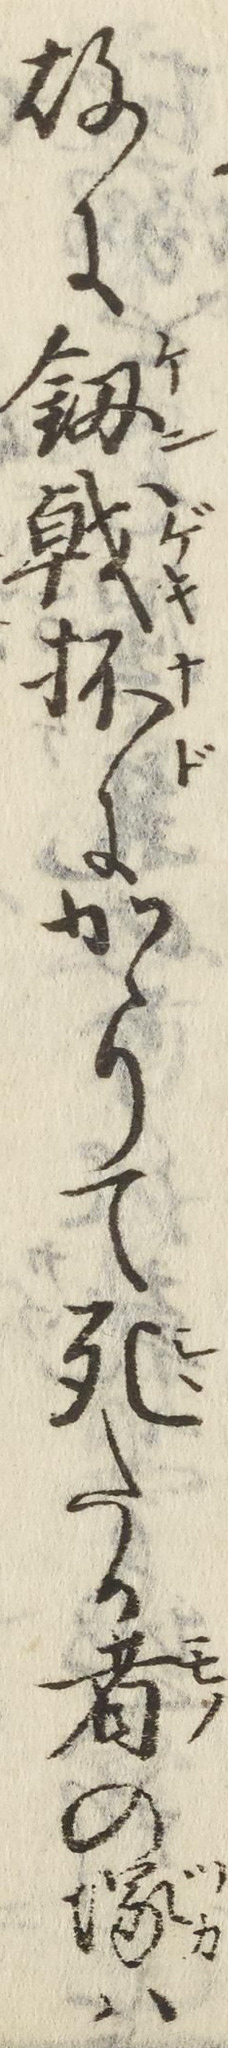故に剣戟抔にかゝりて死たる者の塚は
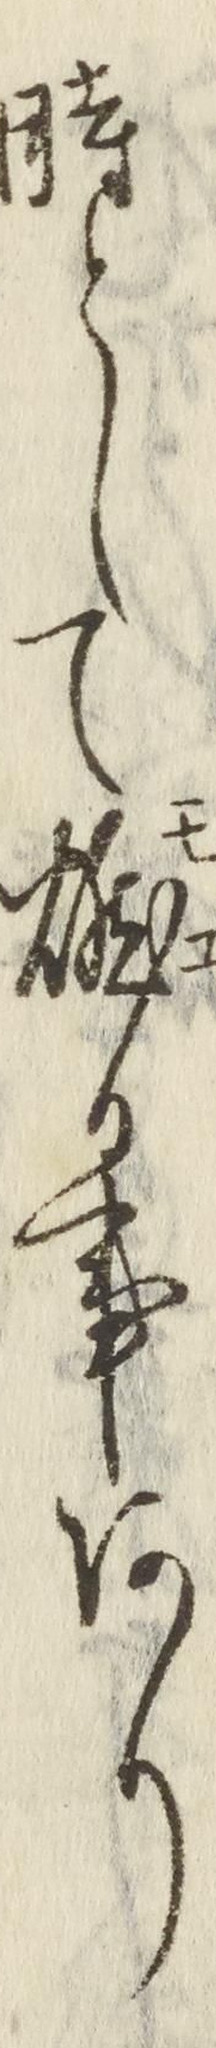時として燃る事あり
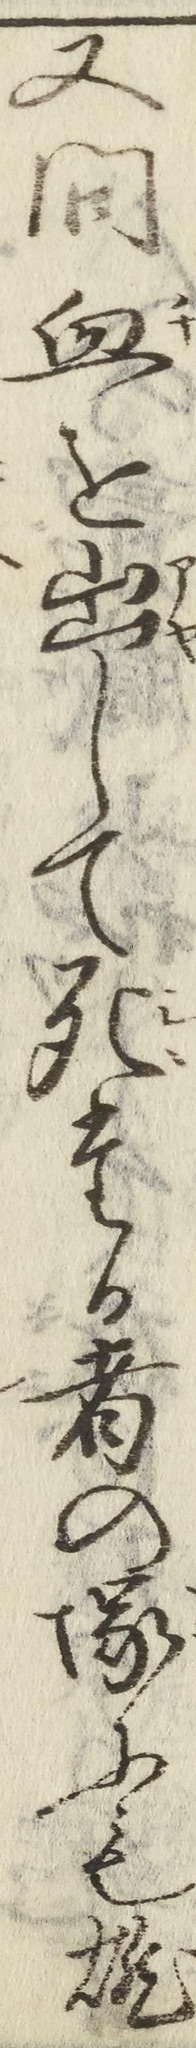又問血を出して死たる者の塚にも燃
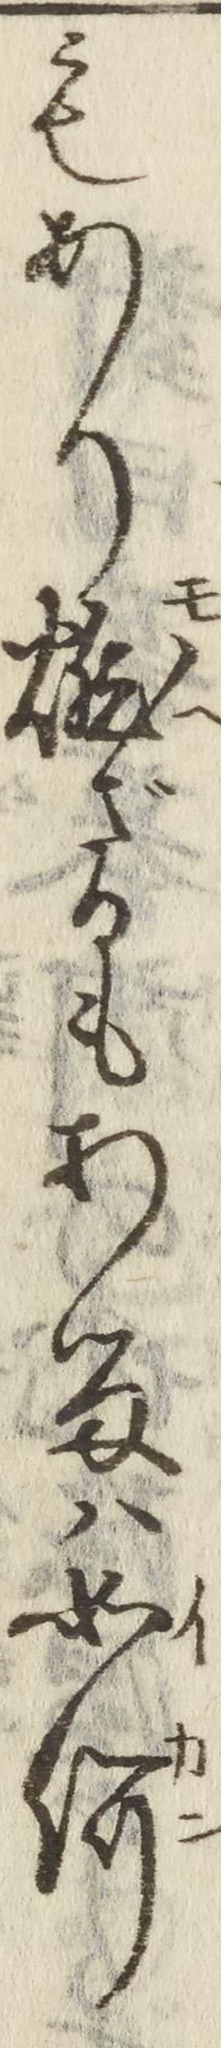もあり燃ざるもあるは如何
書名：天地或問珍　地
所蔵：東京大学地震研究所図書室 Earthquake Research Institute Library, The University of Tokyo, JAPAN
